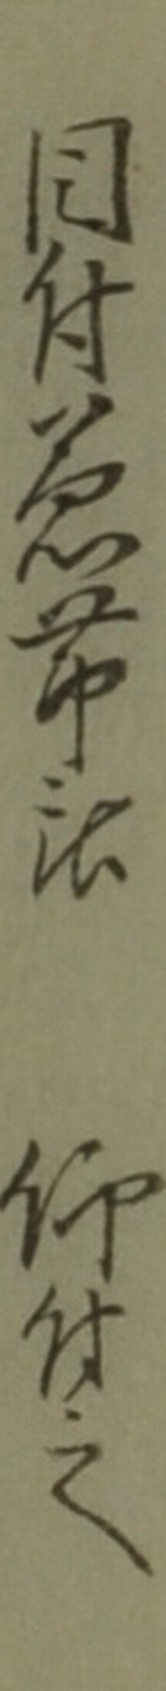目付兼帯被仰付之
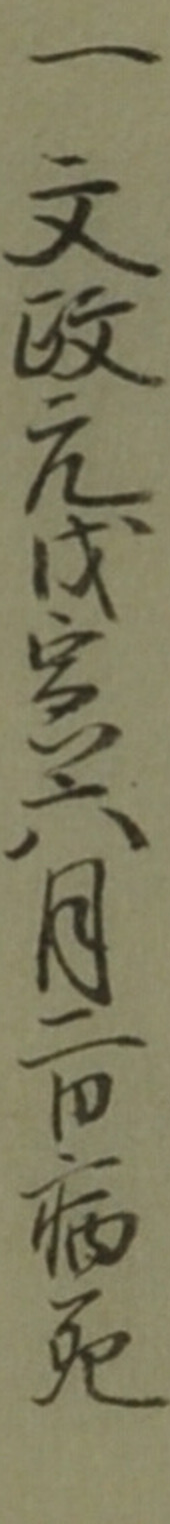一文政元寅六月二日病死
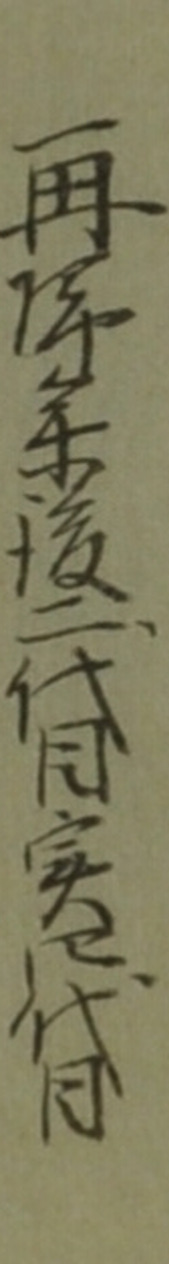再帰参後二代目実四代目
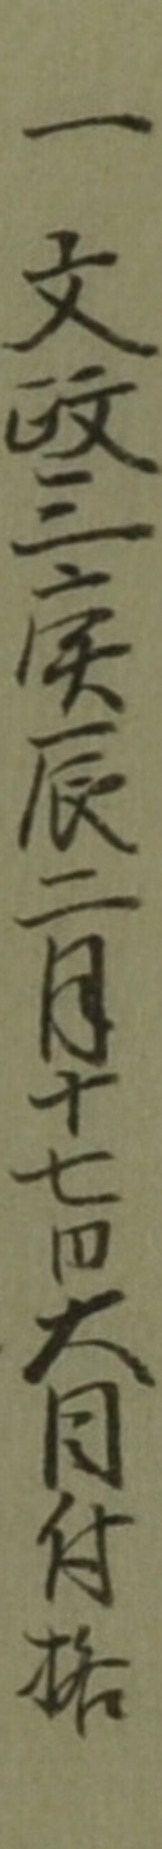一文政三庚辰二月十七日大目付格
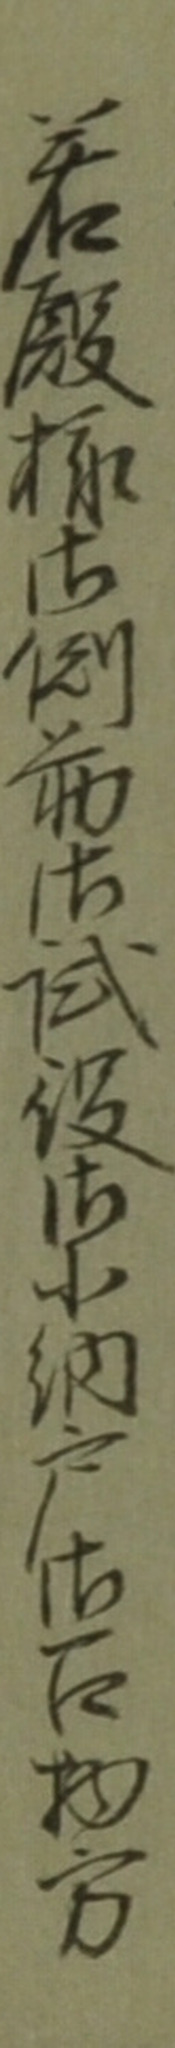若殿様御側勤御試役御小納戸御召物方
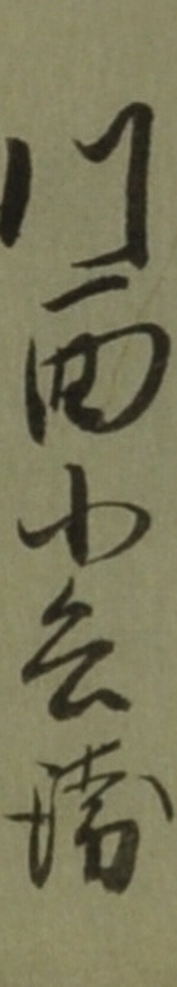川西小兵衛
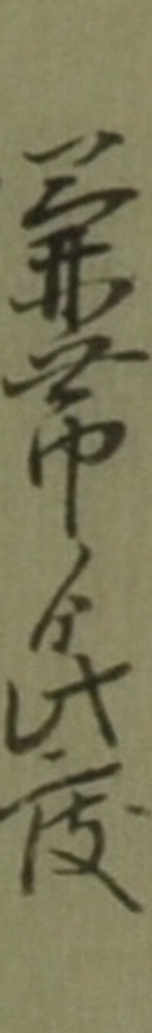兼帯ゟ此度
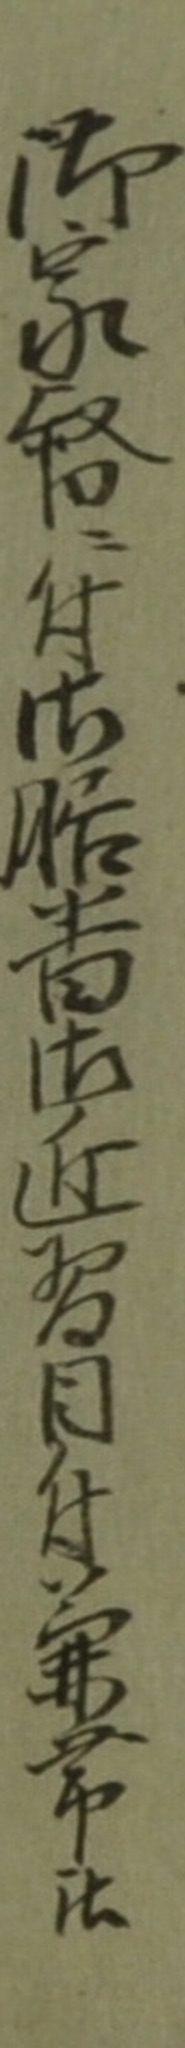御家督ニ付御膳番御近習目付兼帯被
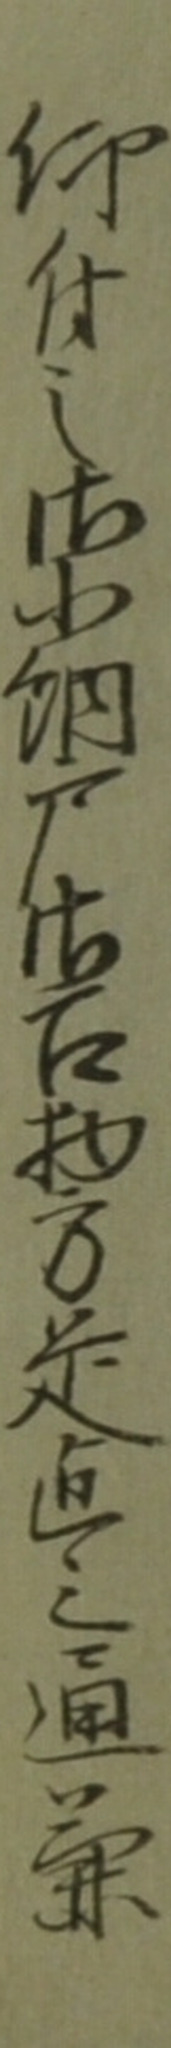仰付之御小納戸御召物方是迄之通兼
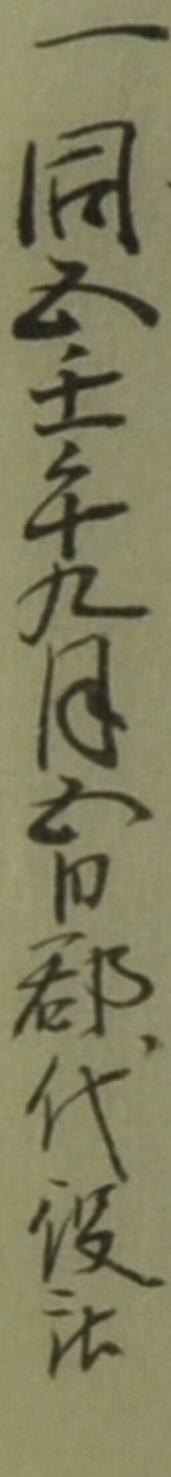一同五壬午九月五日郡代役被

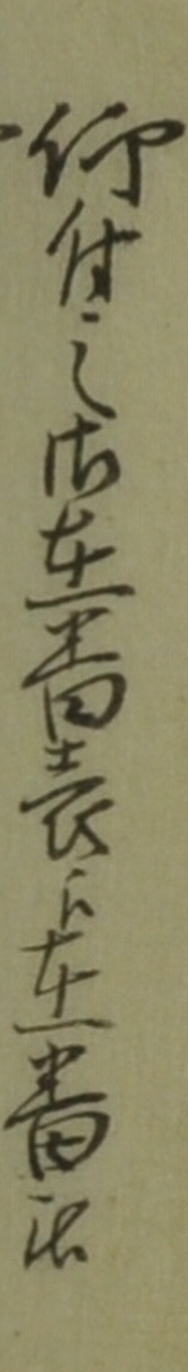仰付之御在番表江在番被
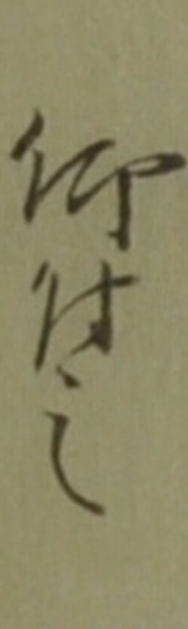仰付之
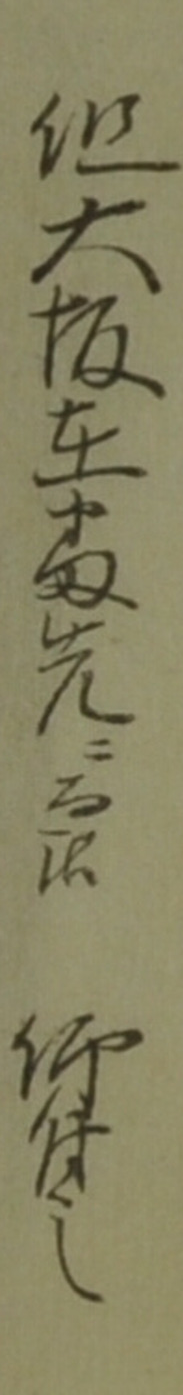但大坂在番先ニ而被仰付之
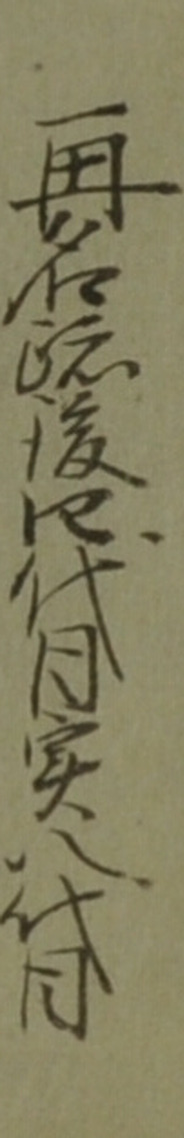再名跡後四代目実八代目
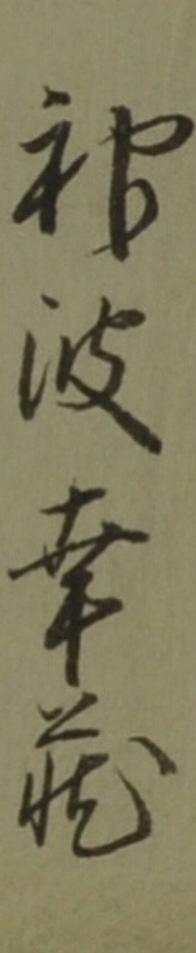神波幸蔵
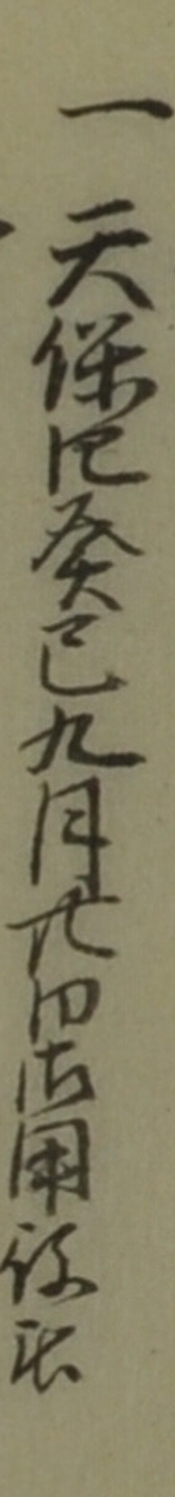一天保四癸巳九月廿日御用役被
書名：諸御役代々録（四）
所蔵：伊那市立高遠町図書館・合同会社AMANE
